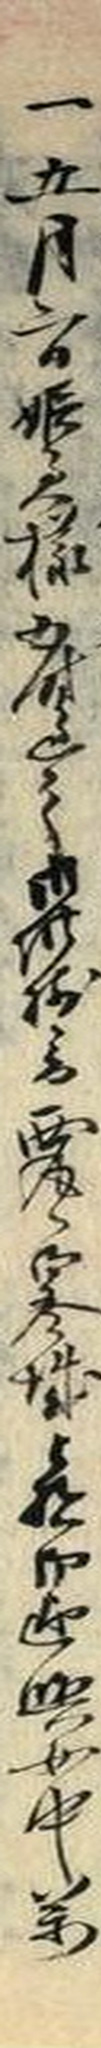一五月二日姫君様五時過之御供揃ニ而西丸へ御登城被遊御迎御輿女中万
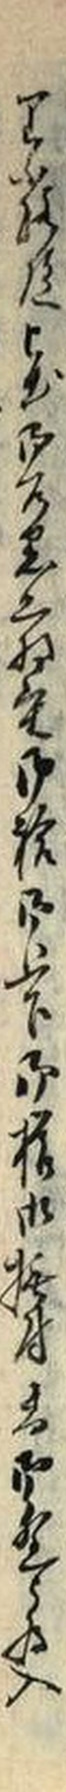里小路殿被出御召黒二羽重御袷御上下御櫛御撫付ニ而御逢被為入
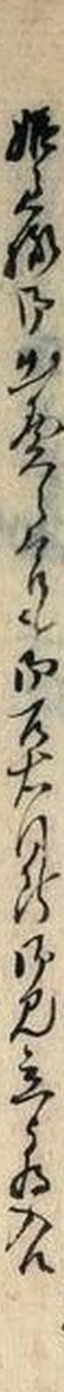姫君様御出殿之節も御召右同断御見立被為入候
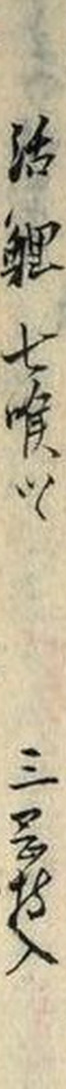活鯉七喉ツヽ三岡持入
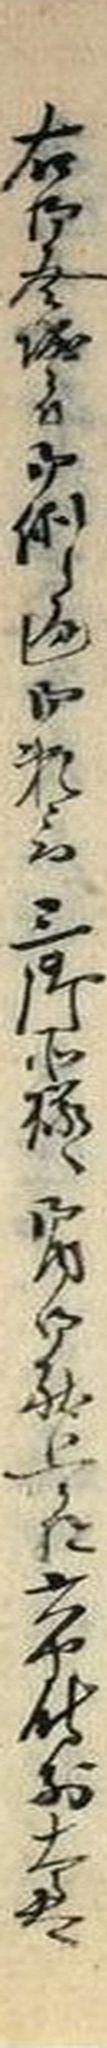右御登城ニ付御例之通御頼ニ而三御所様へ御内御献上被遊六半時前大奥へ
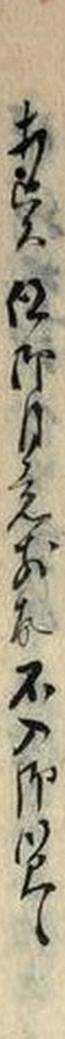相廻ス但御目覚前故不入御覧候
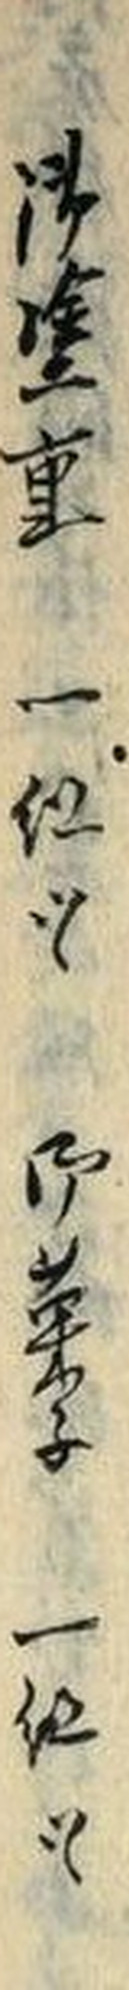御塗重一組ツヽ御菓子一組ツヽ

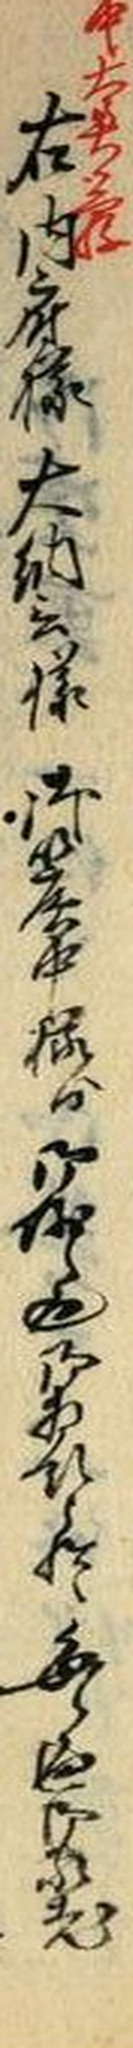右内府様大納言様御簾中様ゟ御例之通御拝領被遊候毎之通御家老
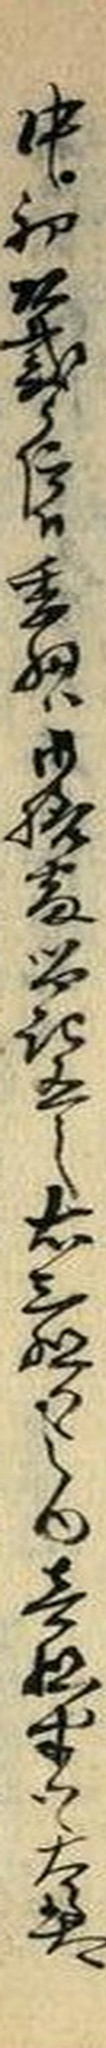中初頂戴被仰付委細ハ御膳番留記有之右三組ツヽ之内壱組半ツヽ大奥へ
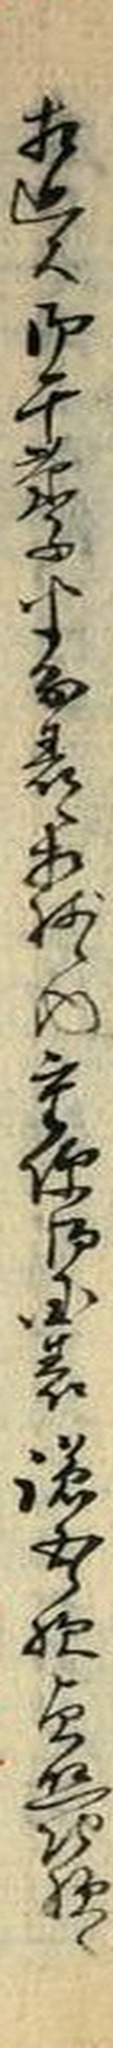相廻ス御干菓子半分表へ相残候内重便御国表謙五郎様貞照院様へ
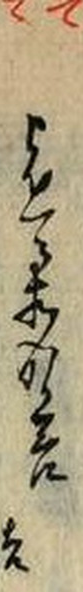被進ニ相成候筈
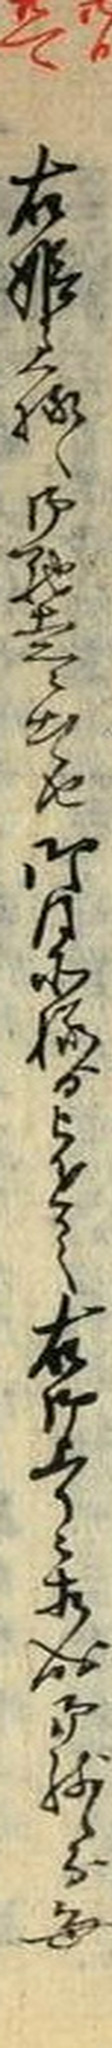右姫君様へ御馳走ニ出候由御同所様ゟ被進之右御上りニ相成御残之分毎
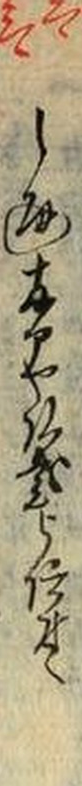之通両部や頂戴被仰付候
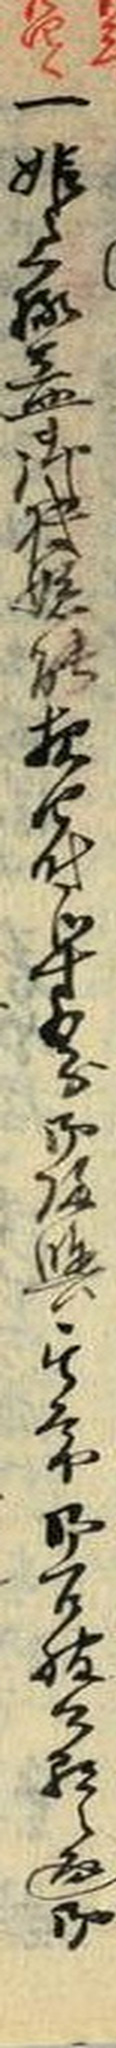一姫君様益御機嫌能夜四時弐寸五分御帰輿其節御召服今朝之通御
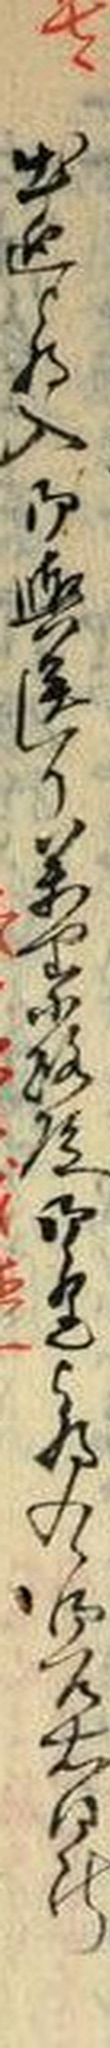出迎被為入御輿送り万里小路殿御逢被為入候御召右同断
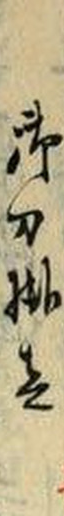御刀掛壱
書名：少傅日録抄（斉承付側向頭取日記、在府）
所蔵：福井県文書館 Fukui Prefectural Archives
